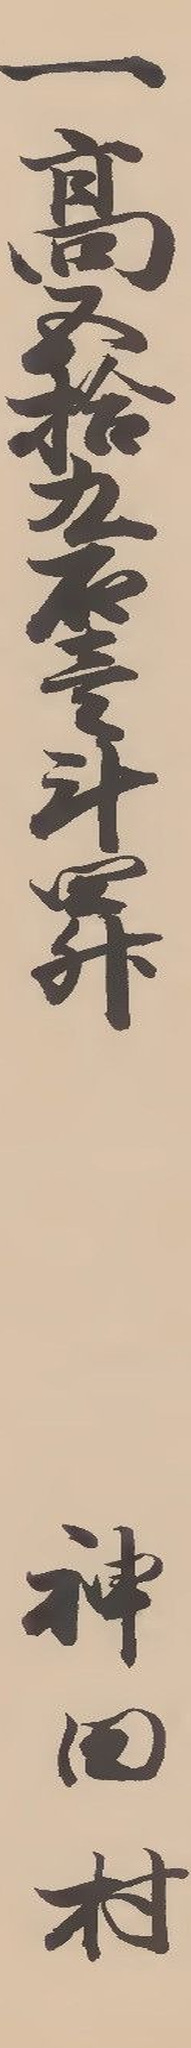一高五拾九石壱斗四升神田村
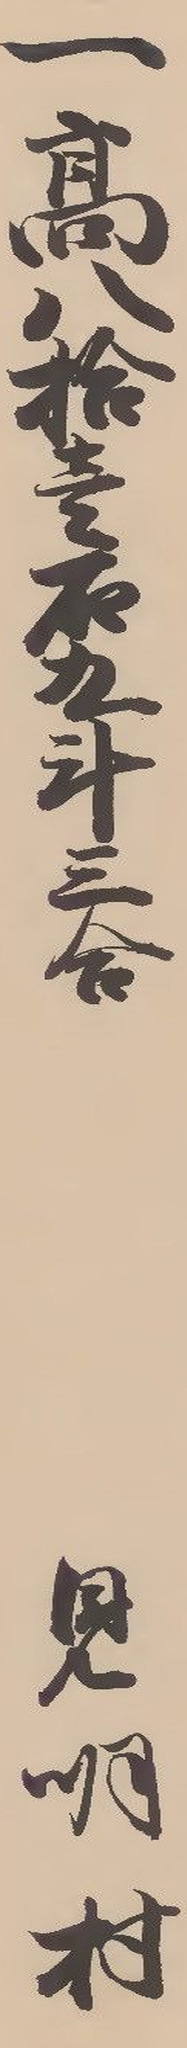一高八拾壱石九斗三合見明村

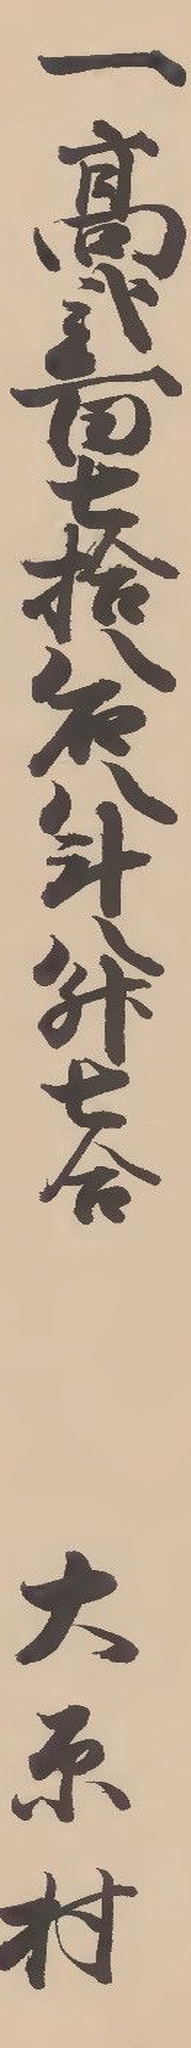一高弐百七拾八石八斗八升七合大原村
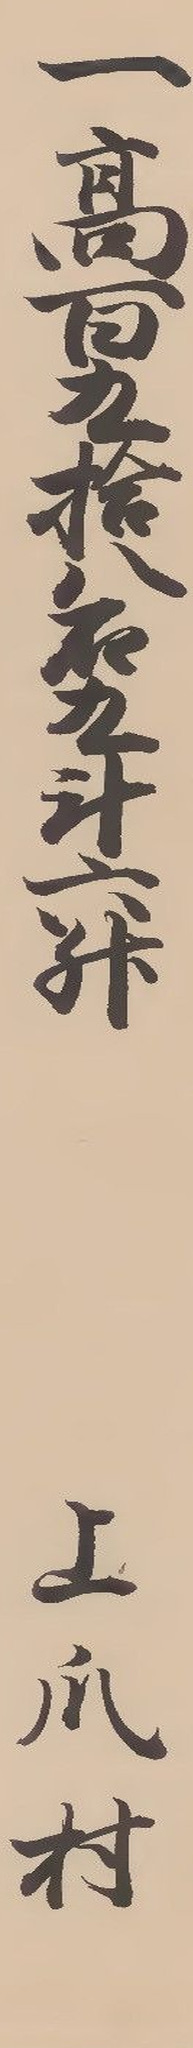一高百九拾八石九斗六升上瓜村
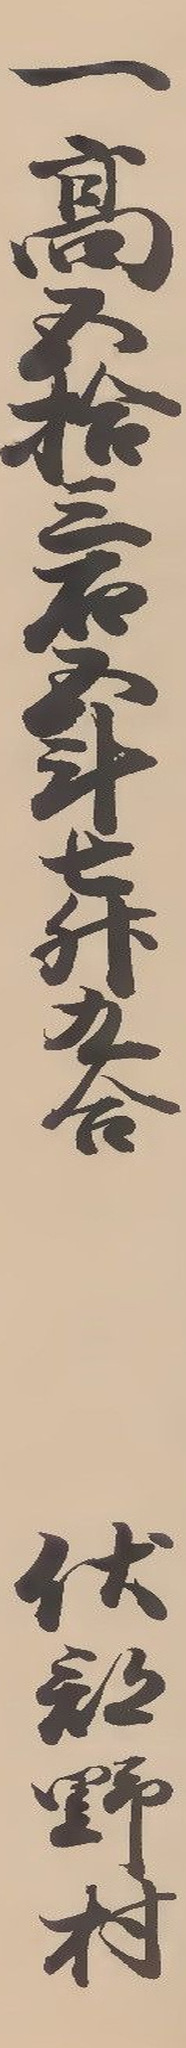一高五拾三石五斗七升九合伏部野村
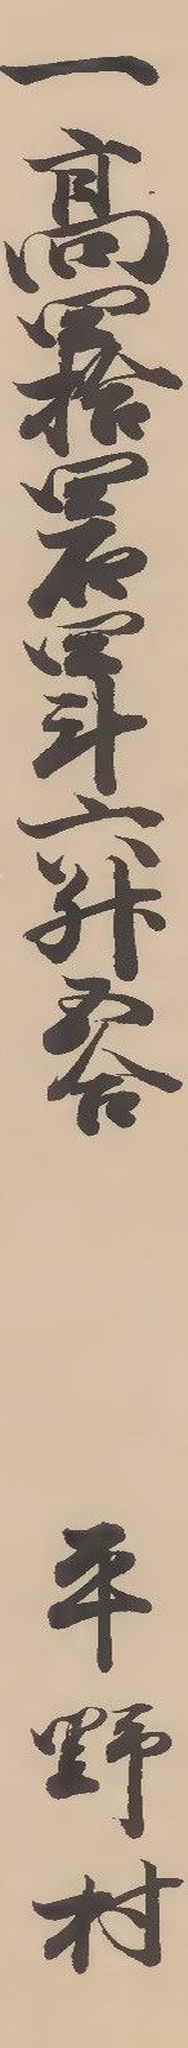一高四拾四石四斗六升五合平野村
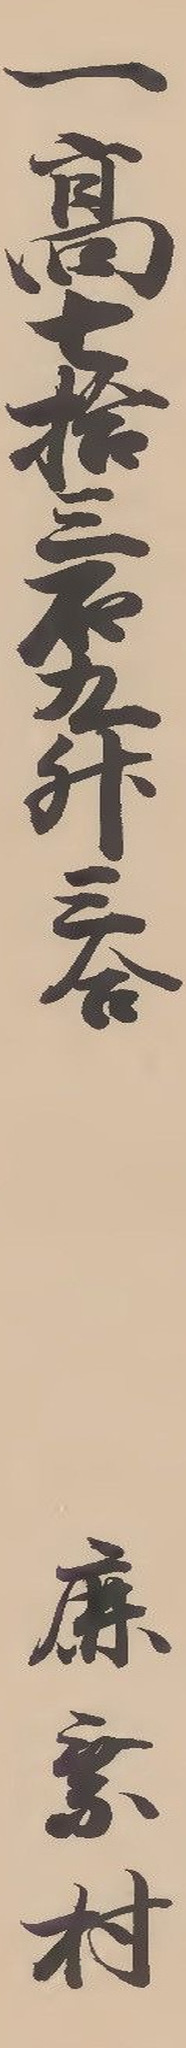一高七拾三石九升三合鹿乗村

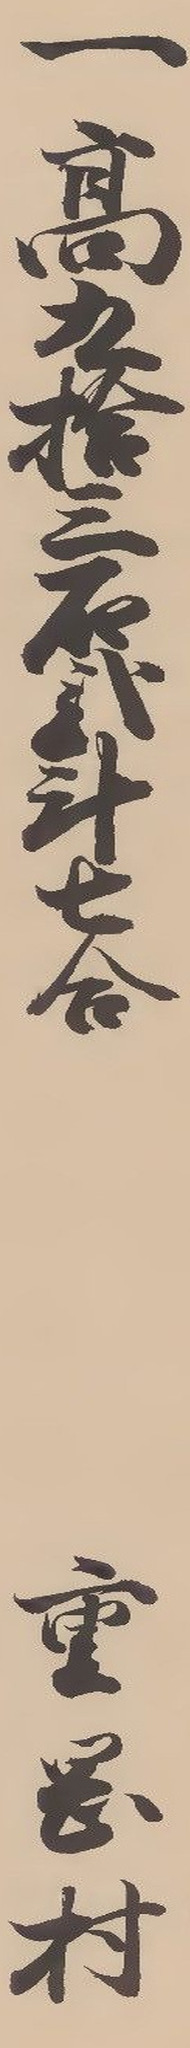一高九拾三石弐斗七合重岡村
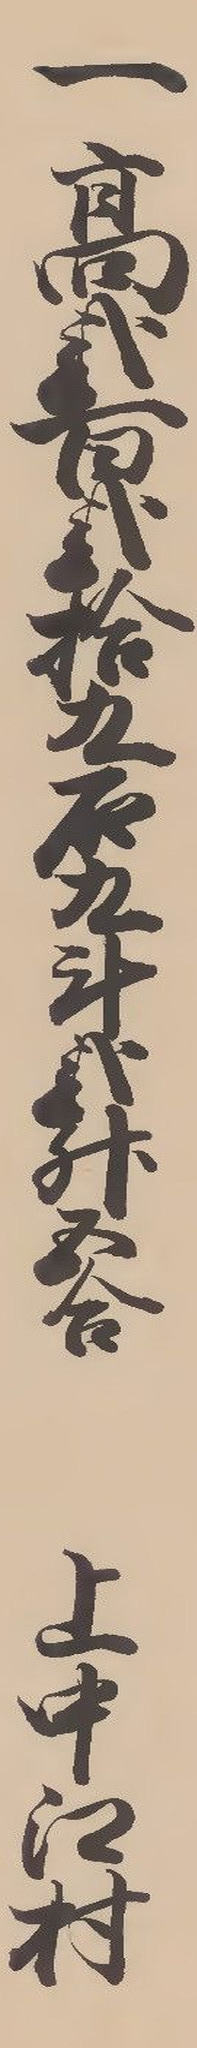一高弐百弐拾九石九斗弐升五合上中江村
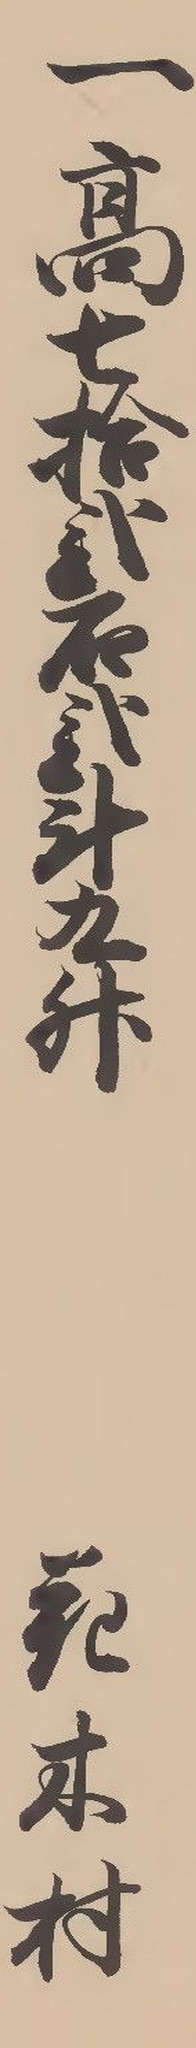一高七拾弐石弐斗九升花木村
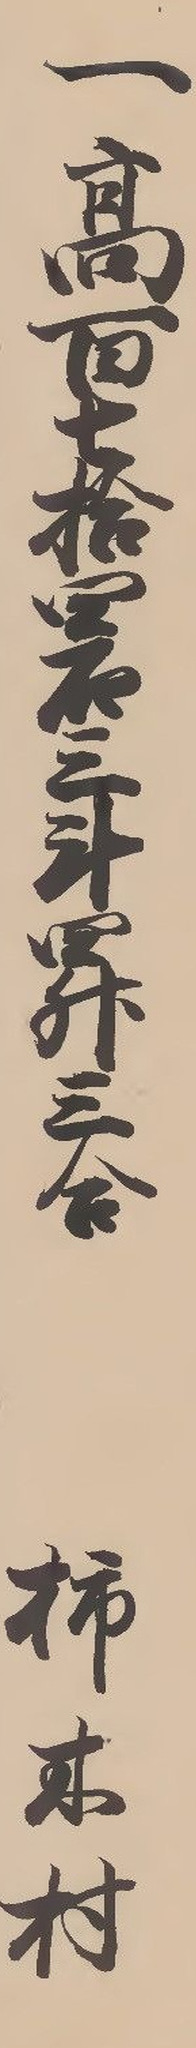一高百七拾四石三斗四升三合柿木村
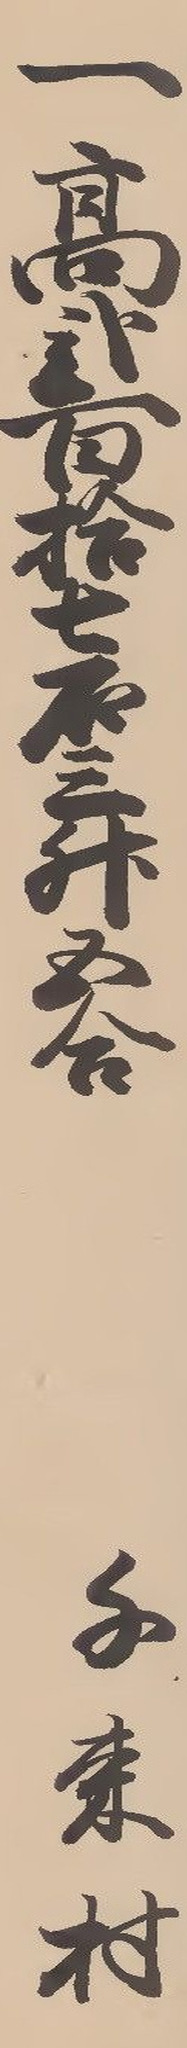一高弐百拾七石三升五合千来村
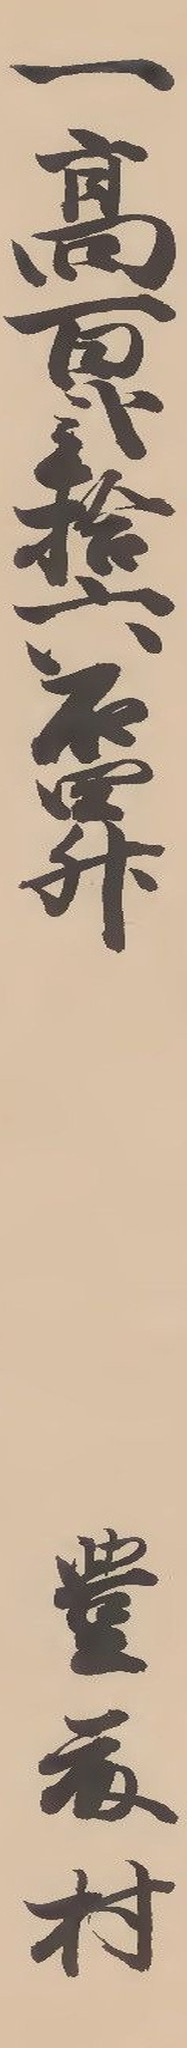一高百弐拾六石四升豊藤村
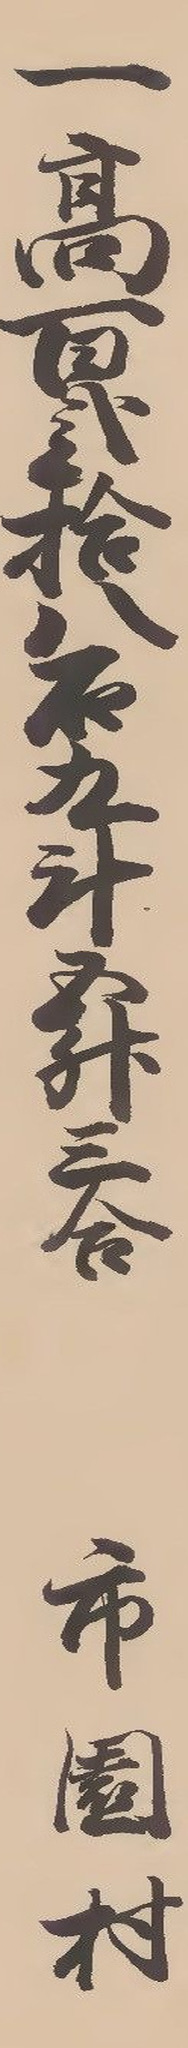一高百弐拾八石九斗五升三合市園村
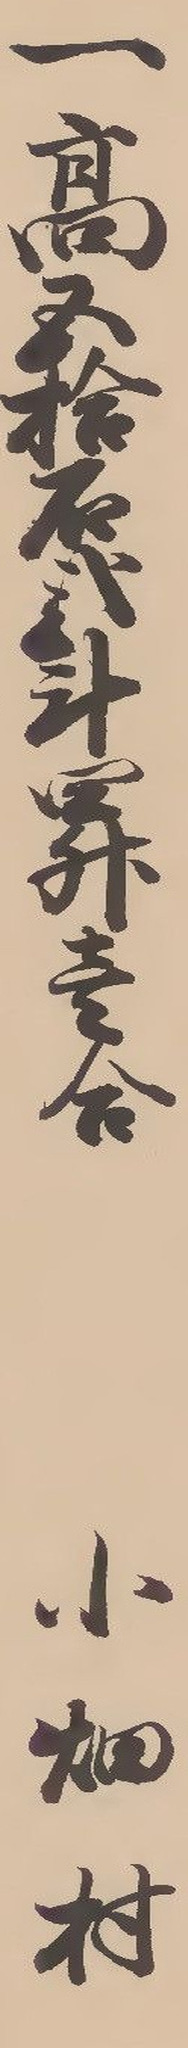一高五拾石弐斗四升壱合小畑村

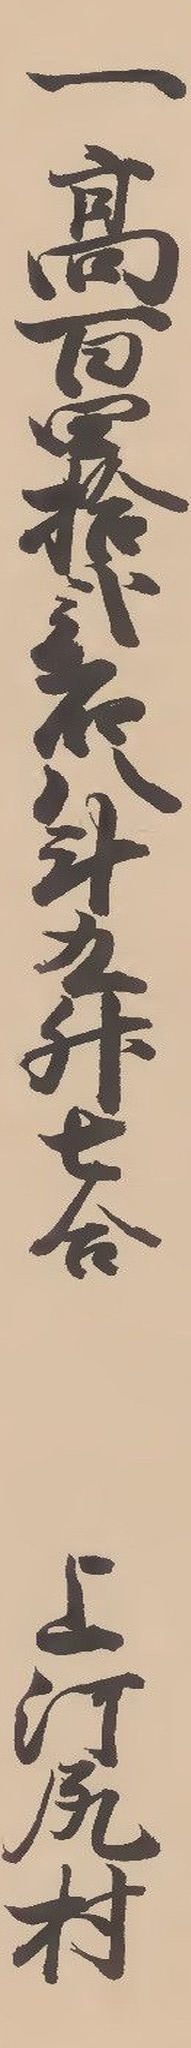一高百四拾弐石八斗九升七合上河尻村
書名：豊後国郷帳
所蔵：国立公文書館 National Archives of Japan
